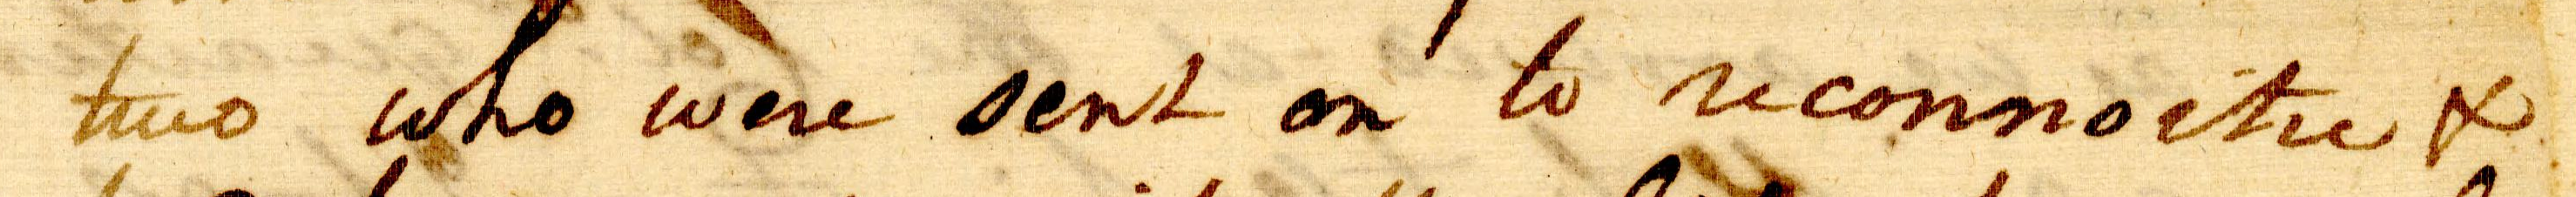two who were sent on to reconnoitre &
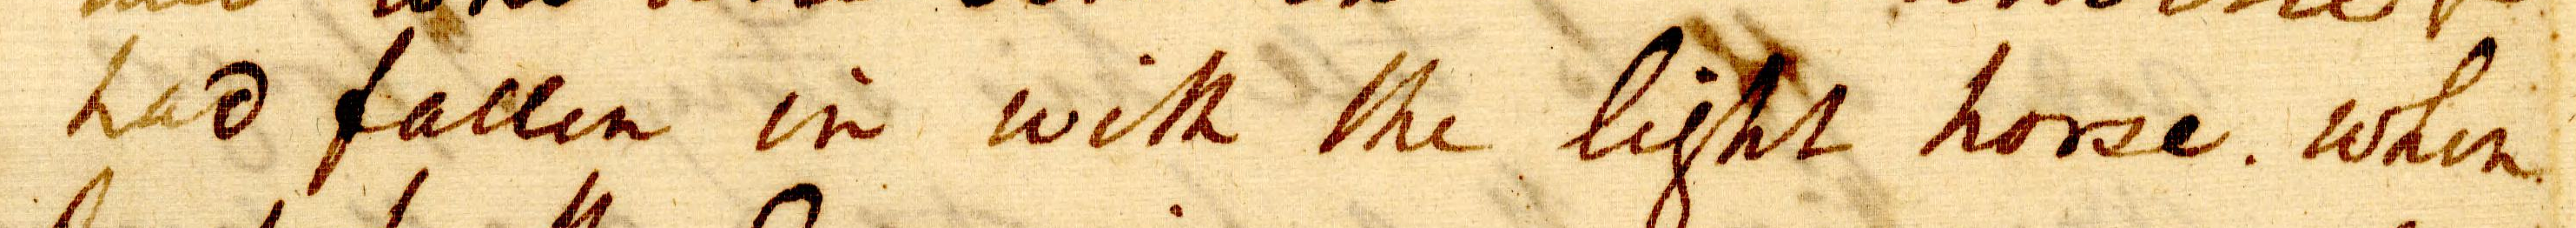had fallen in with the light horse. when
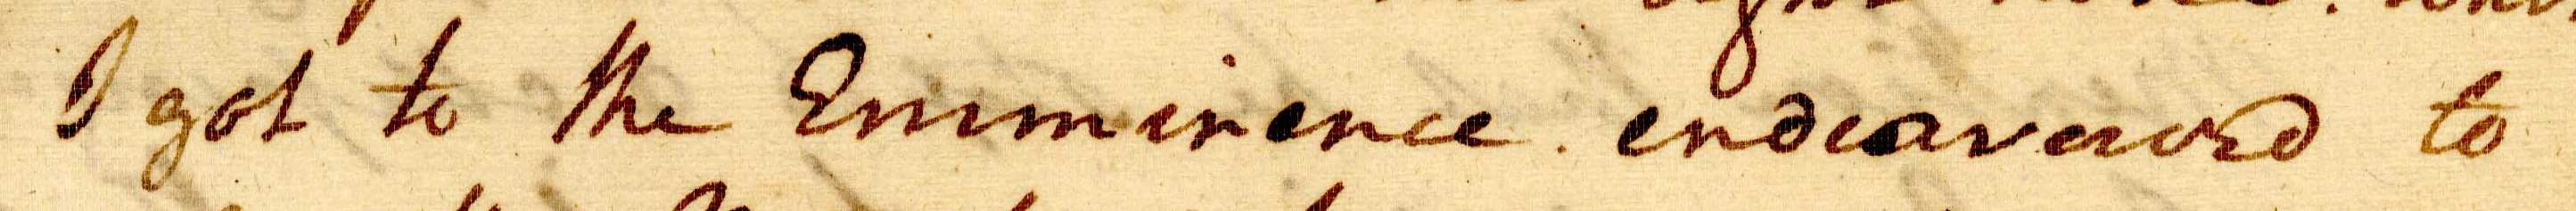I got to the Emminence endeavourd to
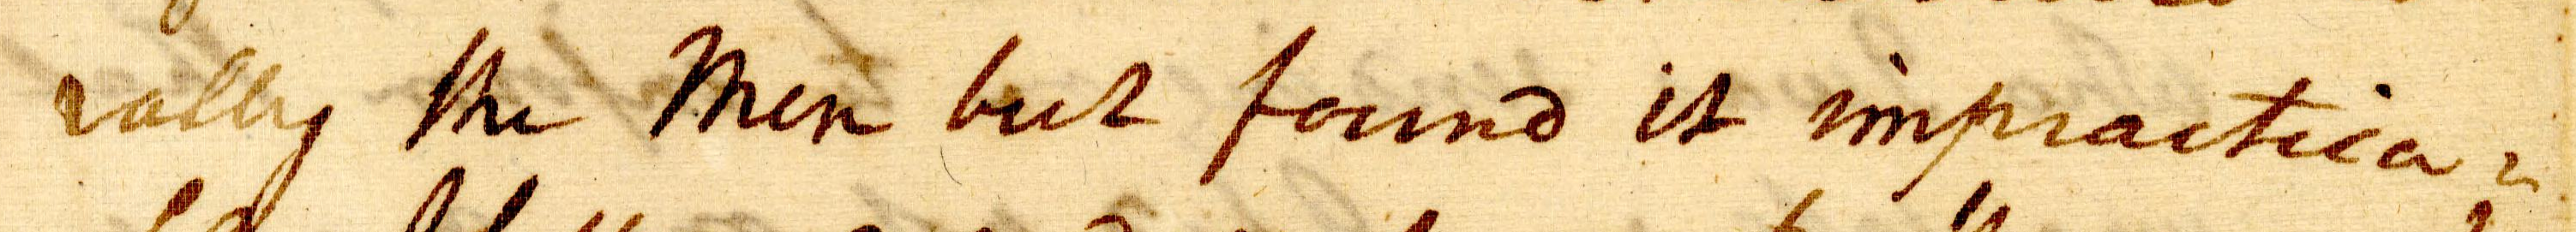rally the Men but found it impractica-
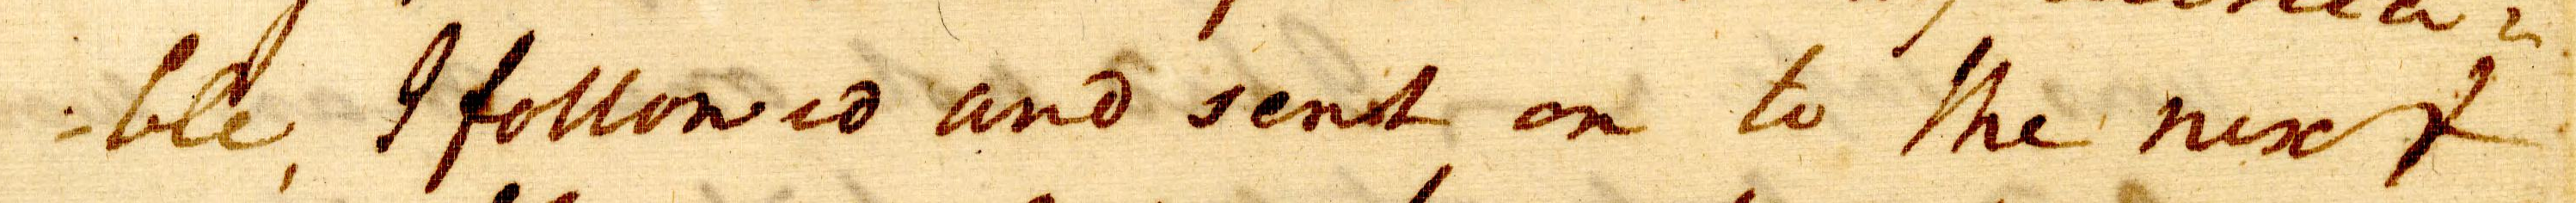-ble, I followed and sent on to the next
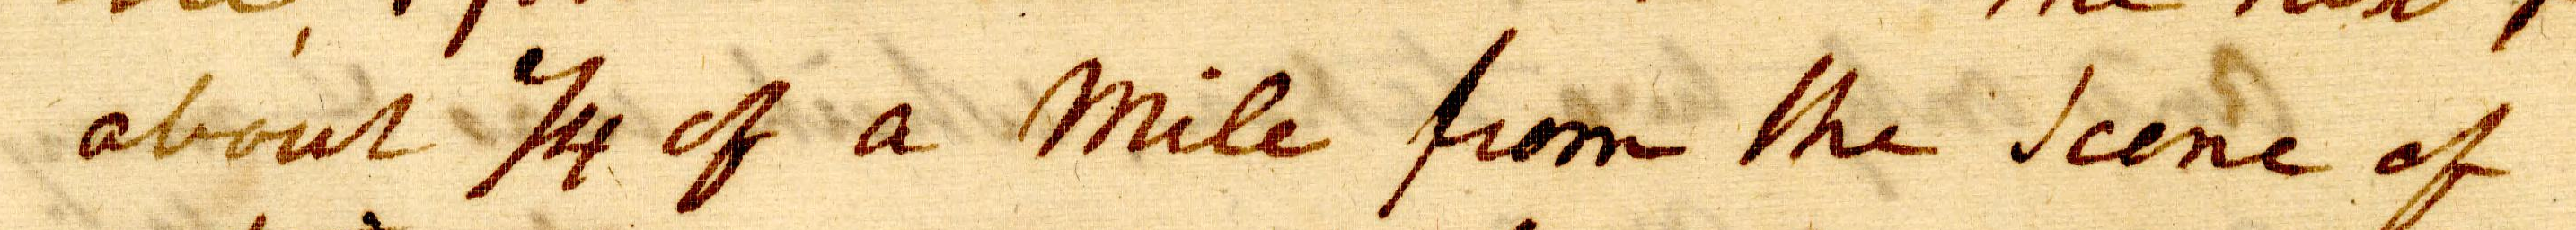about 1/4 of a Mile from the scene of
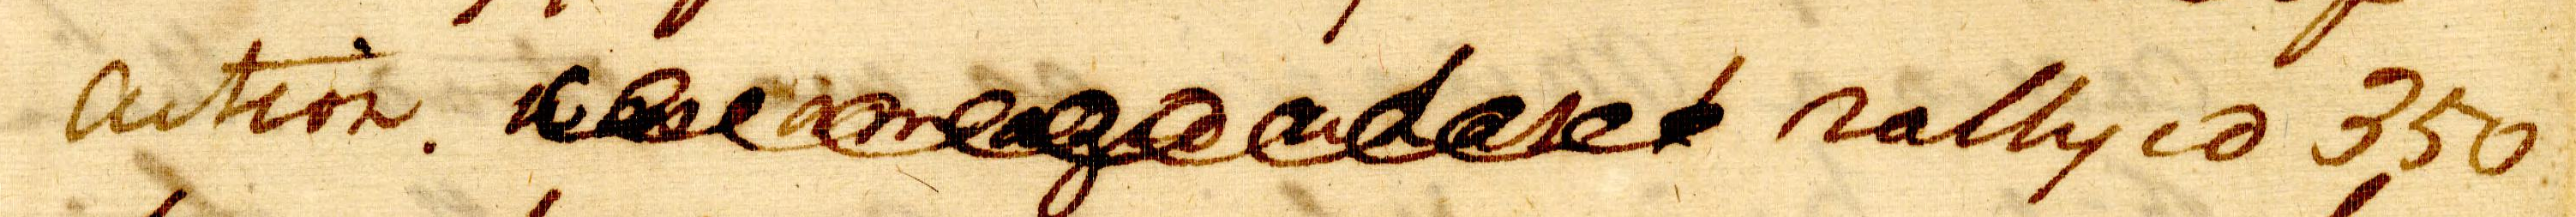action. [___________] rallyed 350
